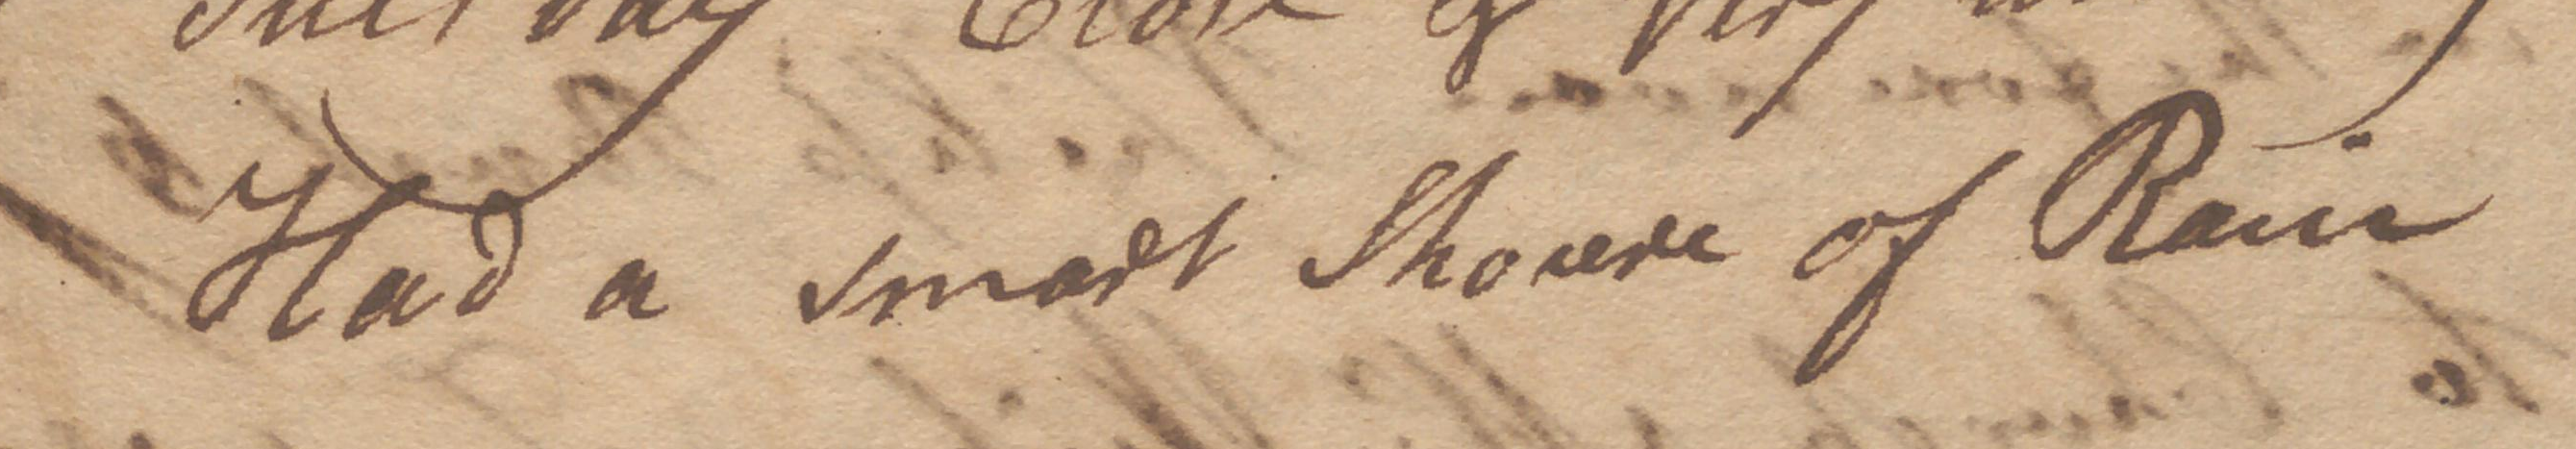Hlad a smart Shoure of Rain
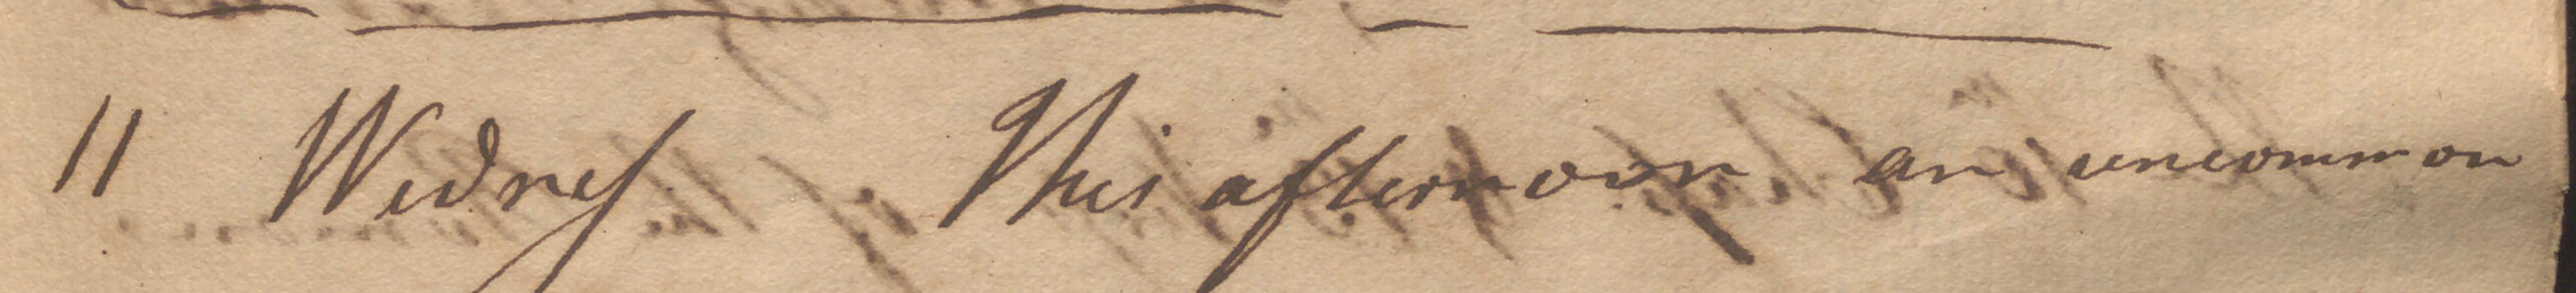11 Wednes This afternoon an uncommon
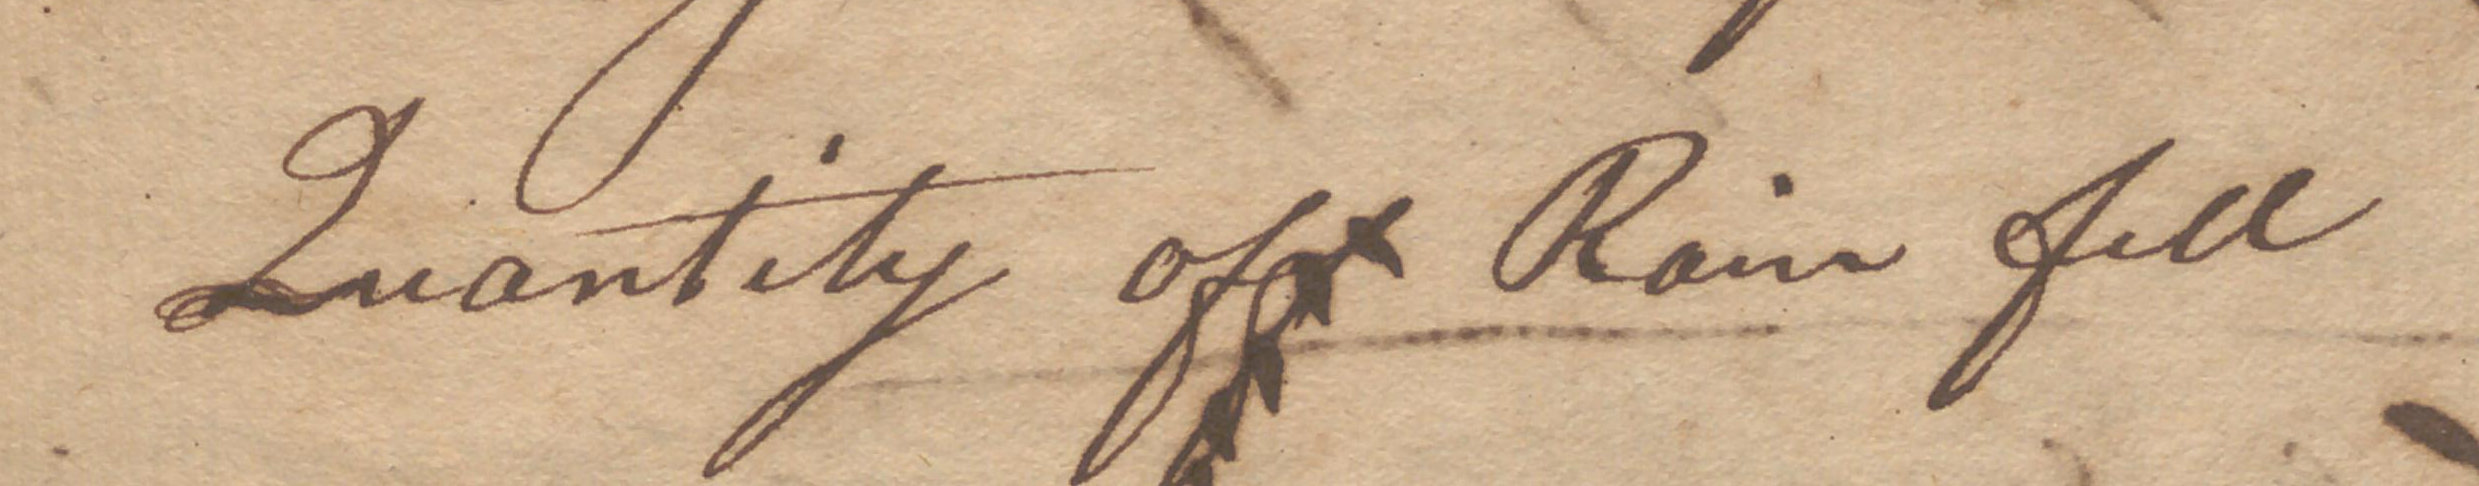Quantity of[_] Rain fell
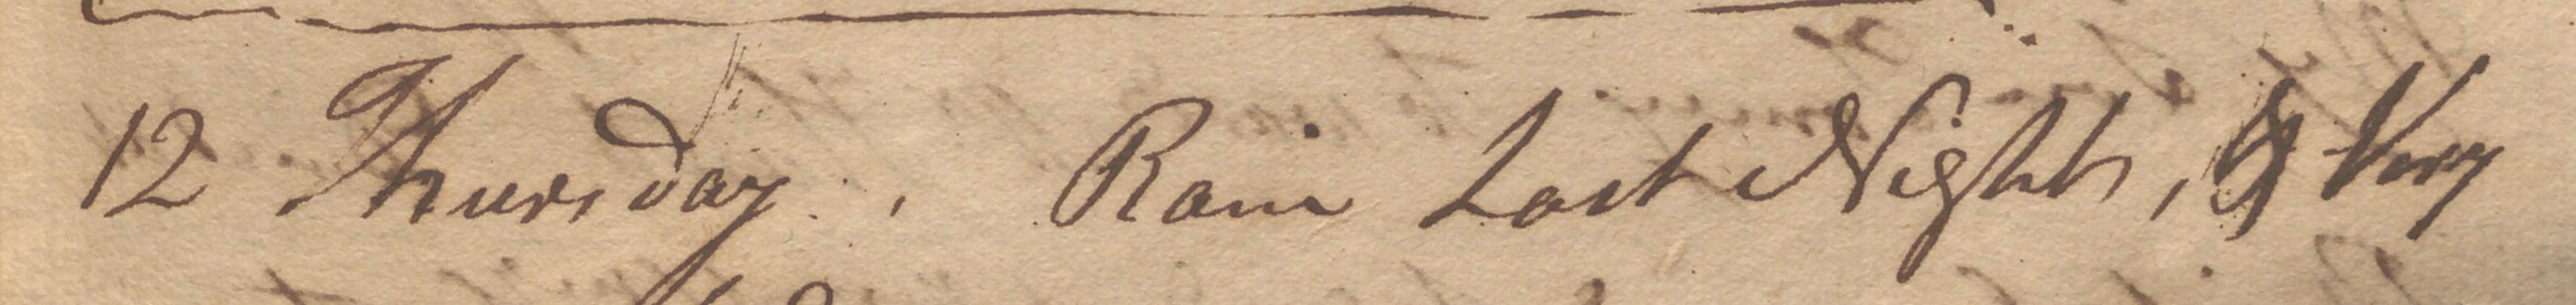12 Thursday. Rain Last Night, 9 Very
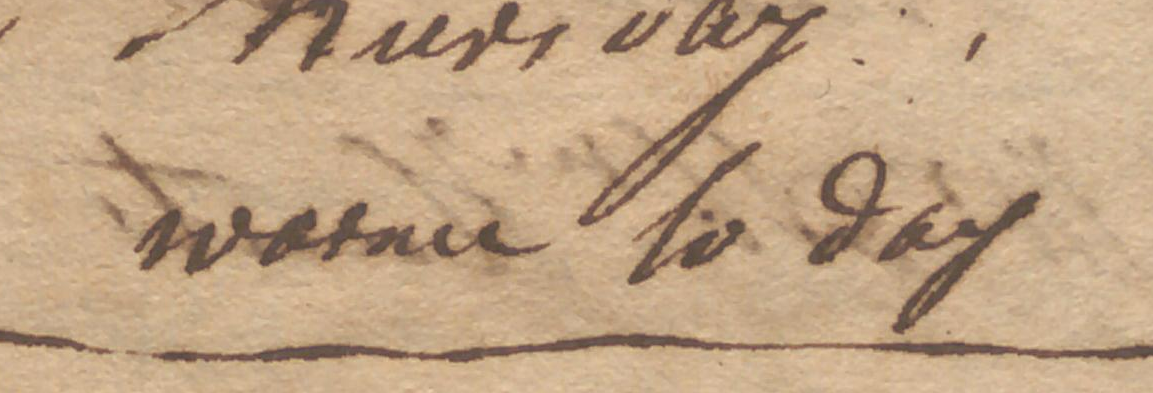warme to day
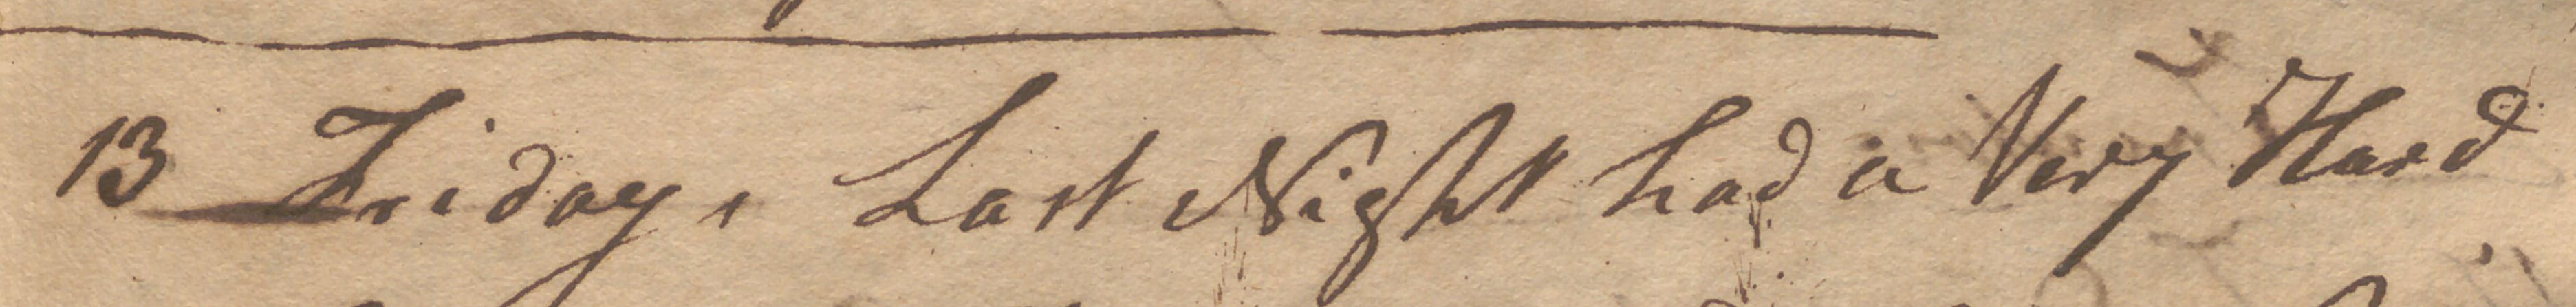13 Friday, Last Night had a Very Hard
